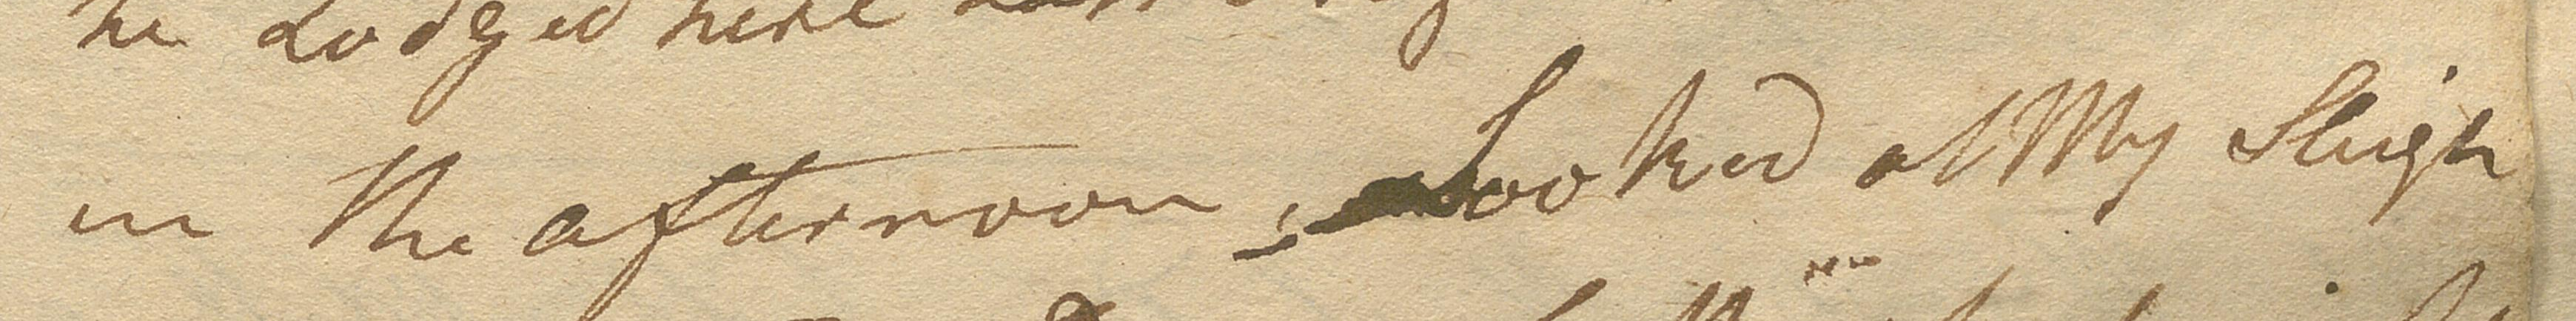in the afternoon, Looked at My Sleigh
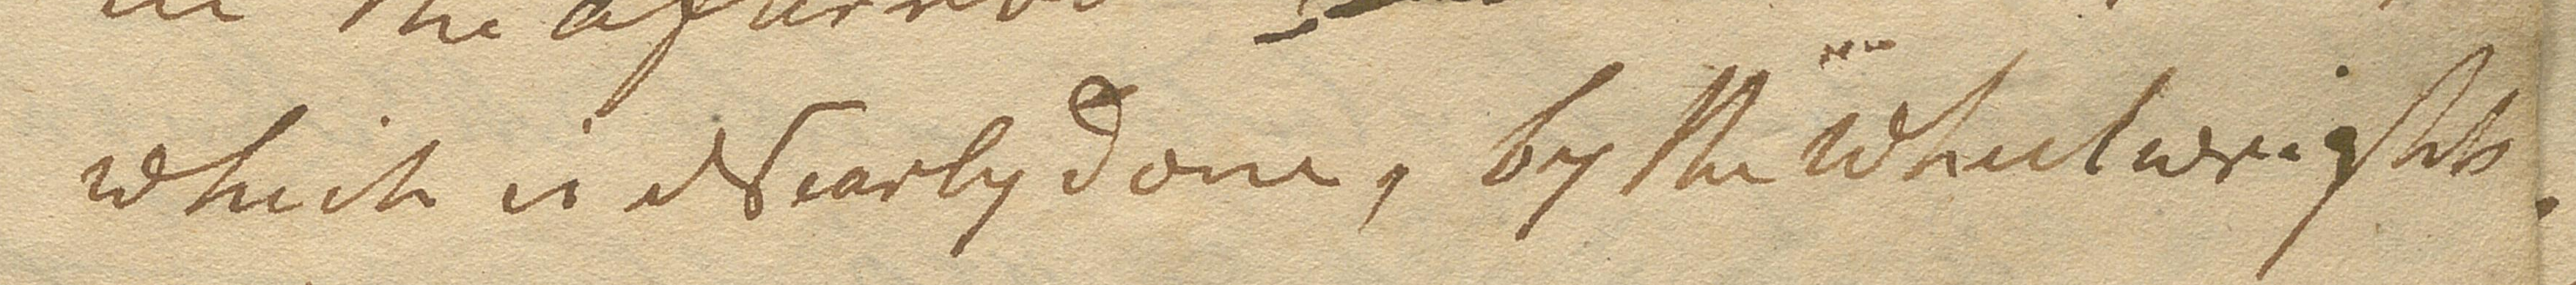which is a Nearly done, by the Wheelwrights
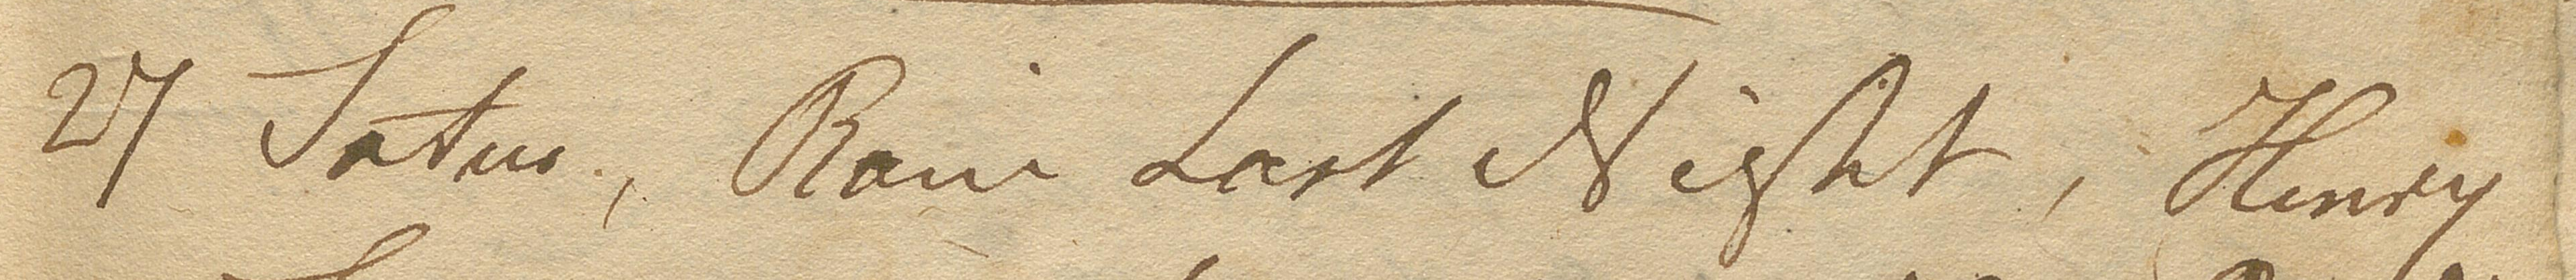27 Satur., Rain Last Night, Henry
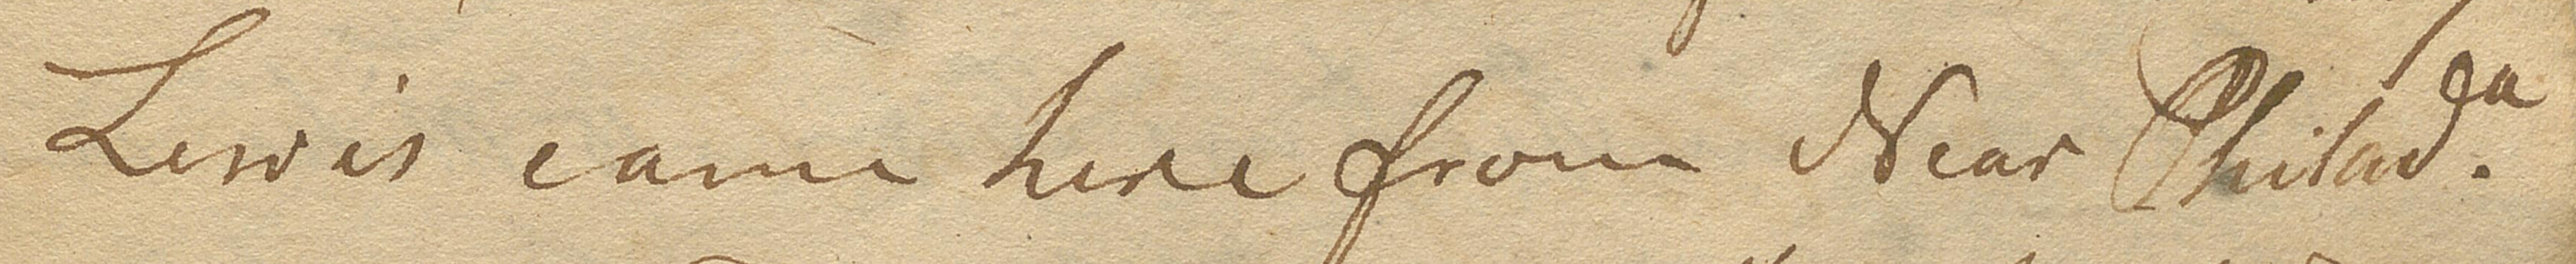Lewis came here from Near Philad^a.
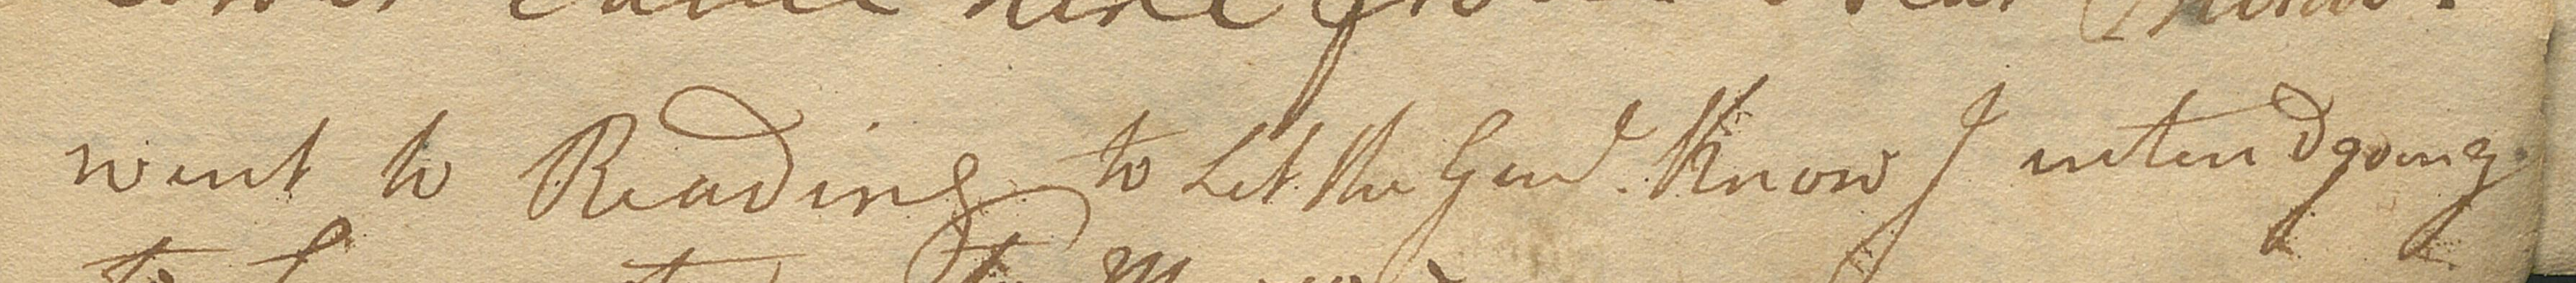went to Reading to Let the Gen^l. Know I intend going
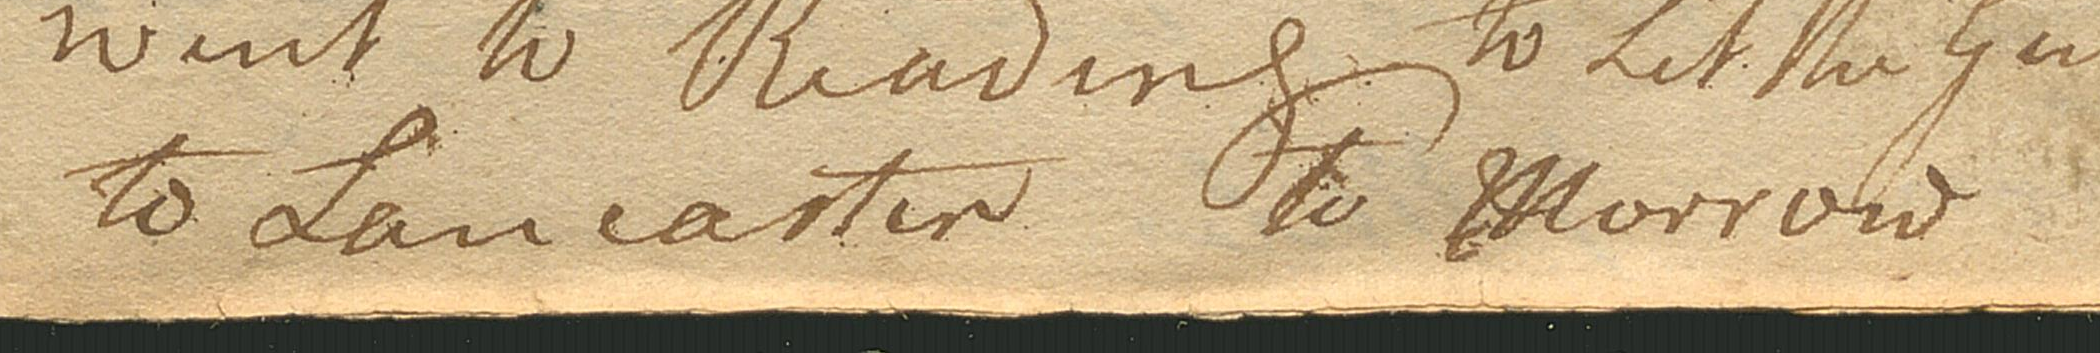to Lancaster to Morrow
